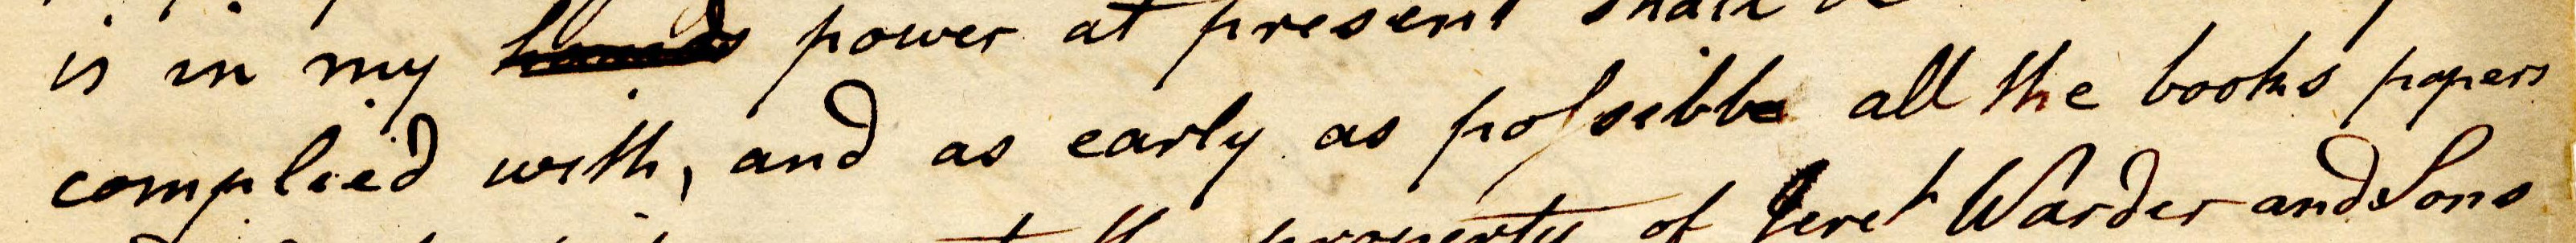complied with, and as early as possible all the books papers
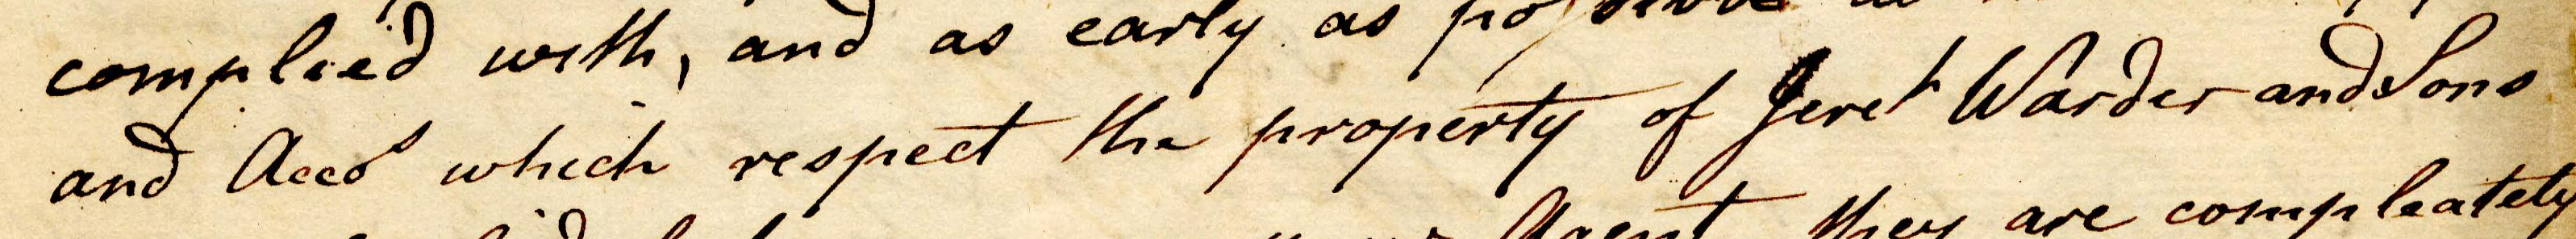and Acco^t which respect the property of Jere^h Warder and Sons
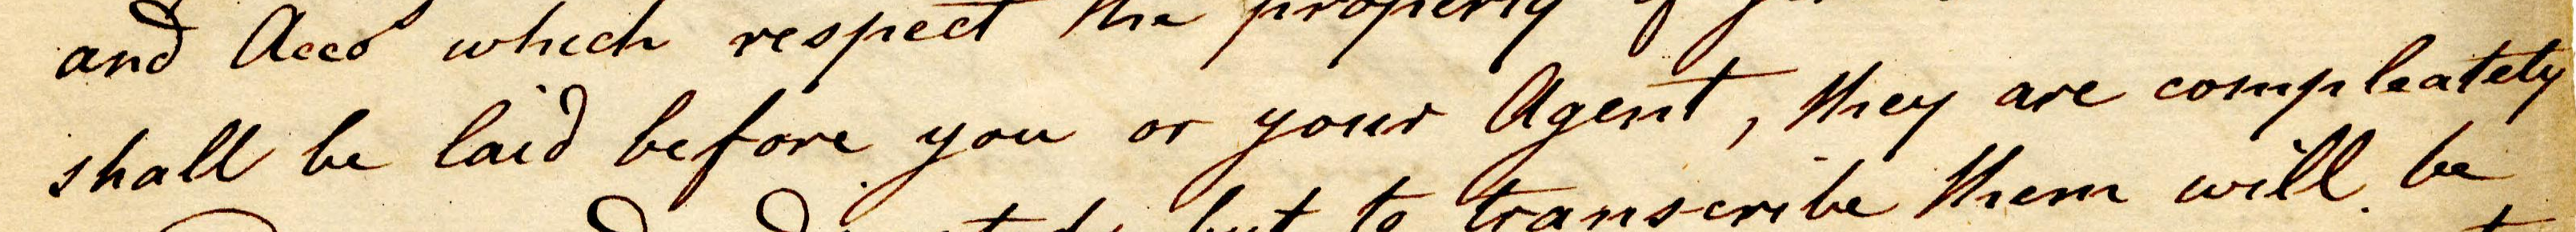shall be laid before you or your Agent, they are compleately
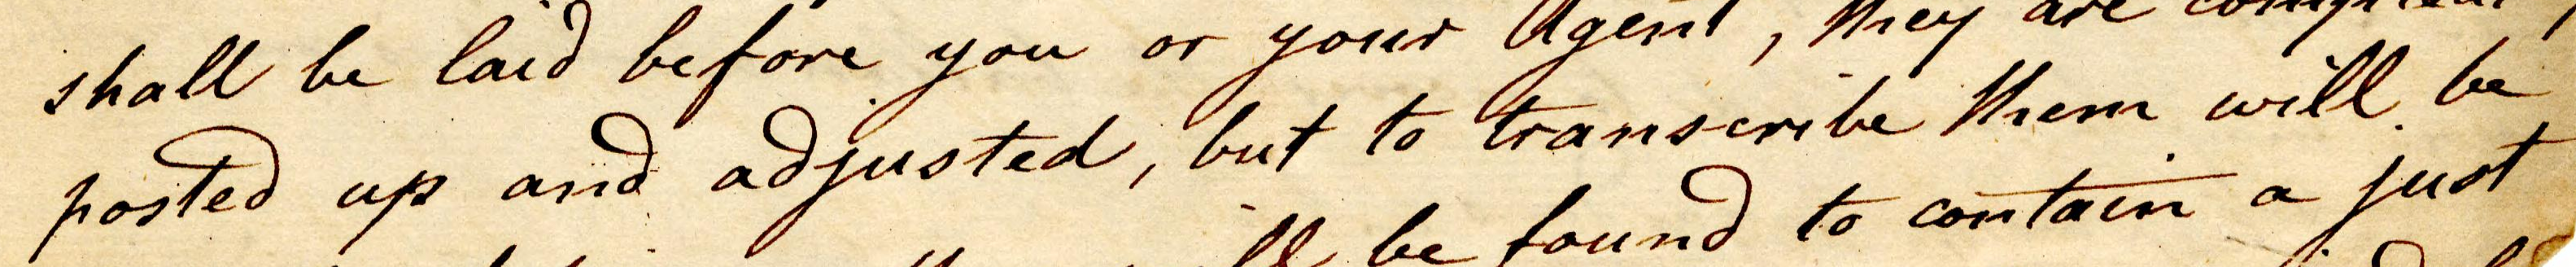posted up and adjusted, but to transcribe them will be
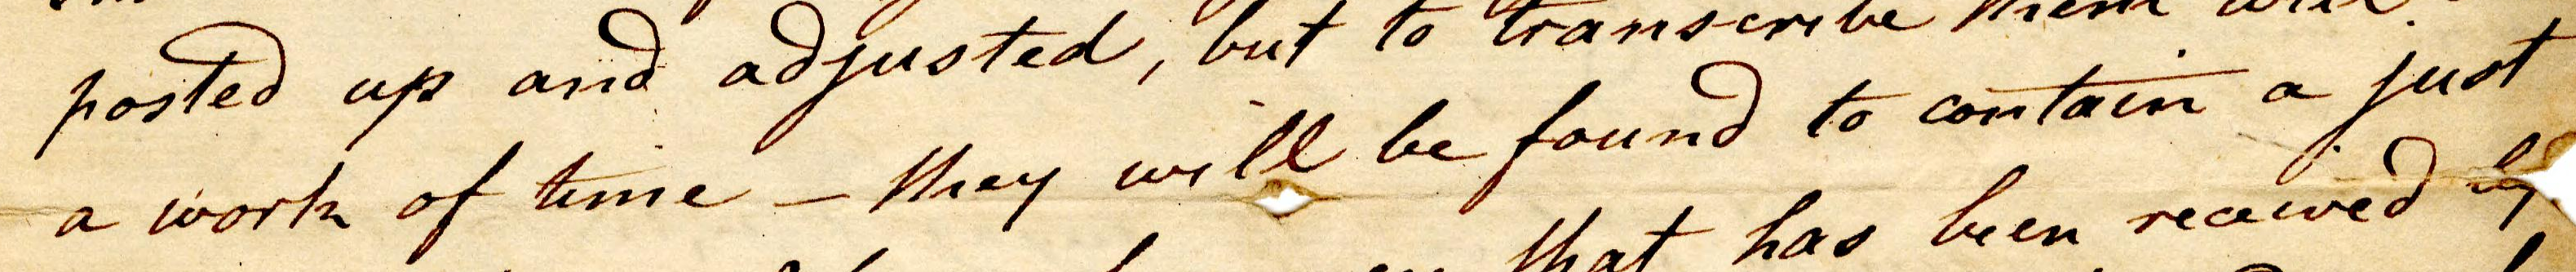a work of time- they will be found to contain a just
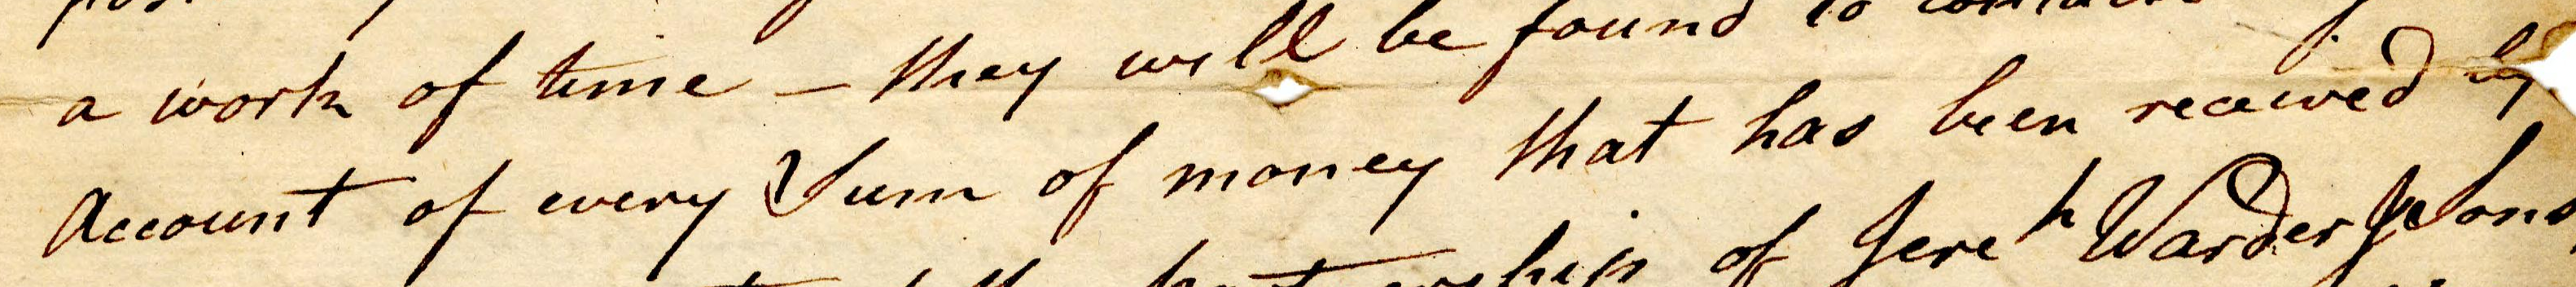Account of every Sum of money that has been received by
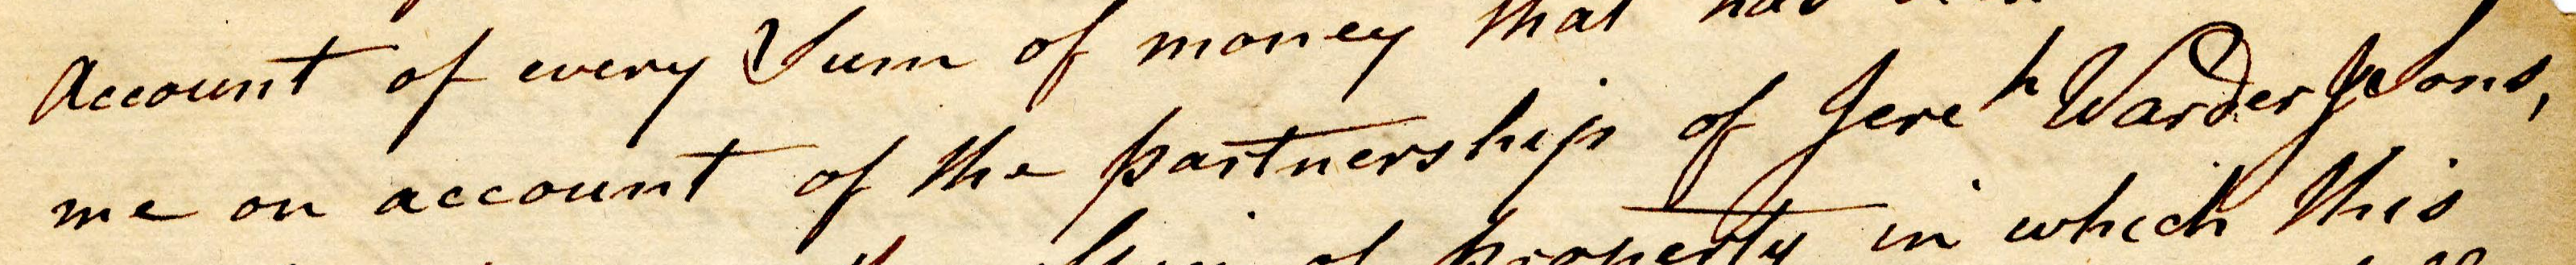me on account of the partnership of Jere^h Warder & Sons,
